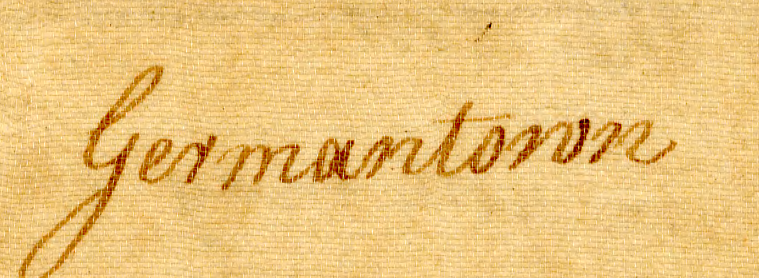Germantown
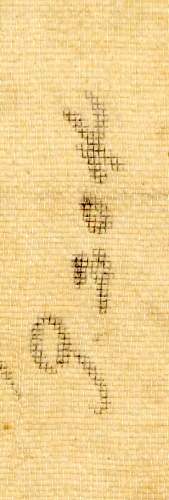9 204
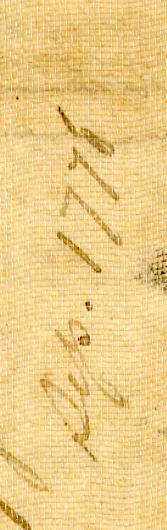Sep, 1776
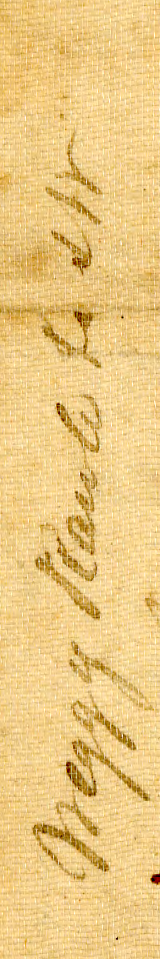Peggy Rawle to SW
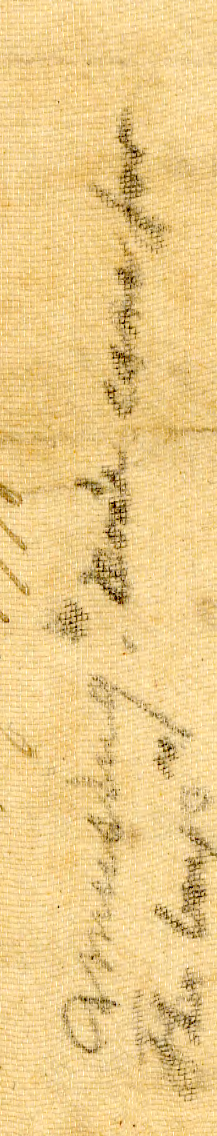amusing. "Don't care for
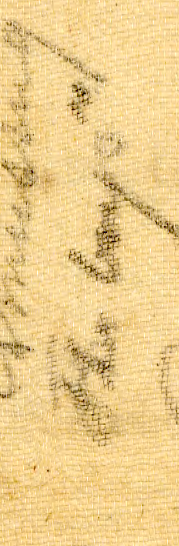The boys"
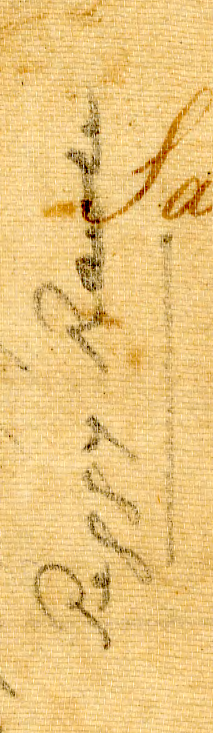Peggy Rawle
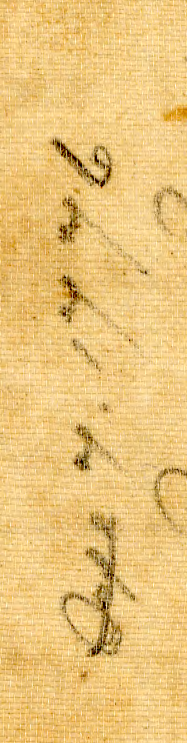Sep. 7 1776
